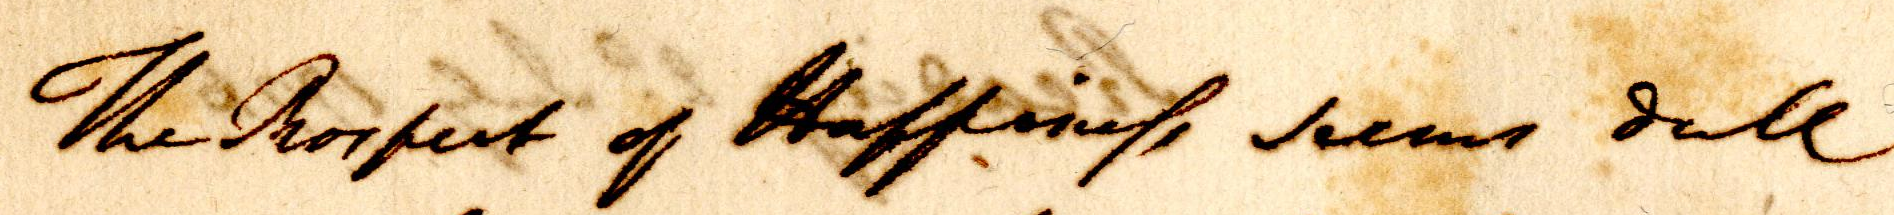The Prospect of Happiness seems dull
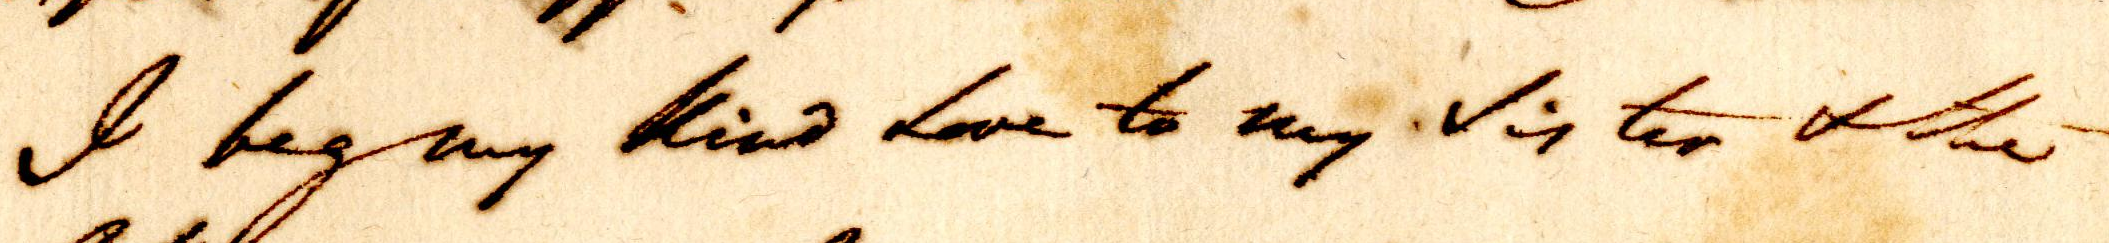I beg my kind Love to my Sister & the
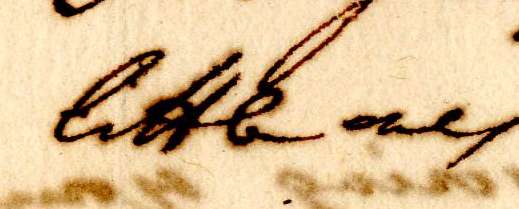little one.
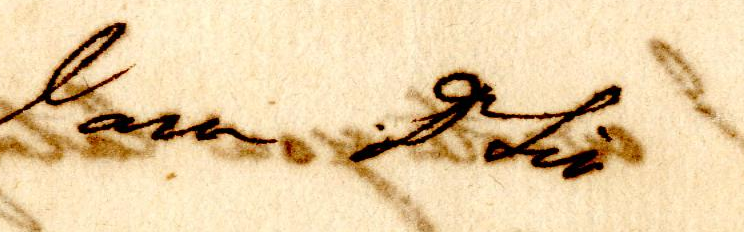I am D^r Sir
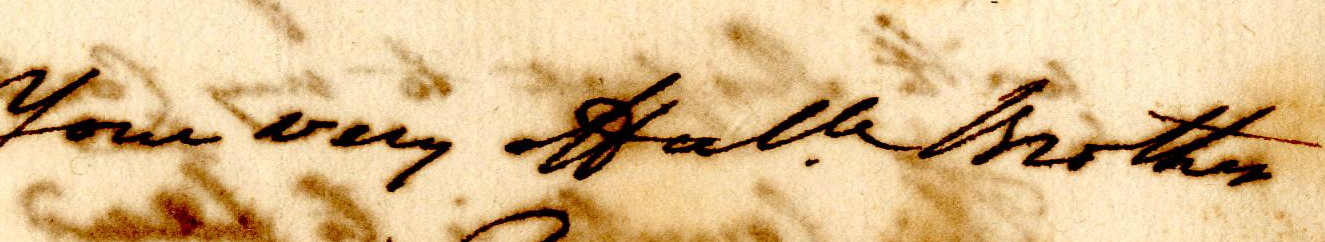Your very affable Brother
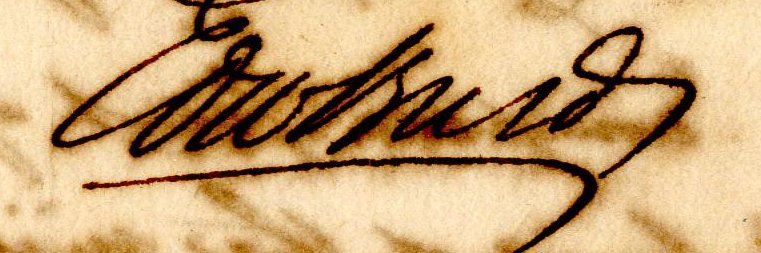Edward
